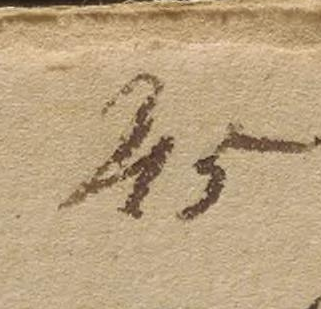45
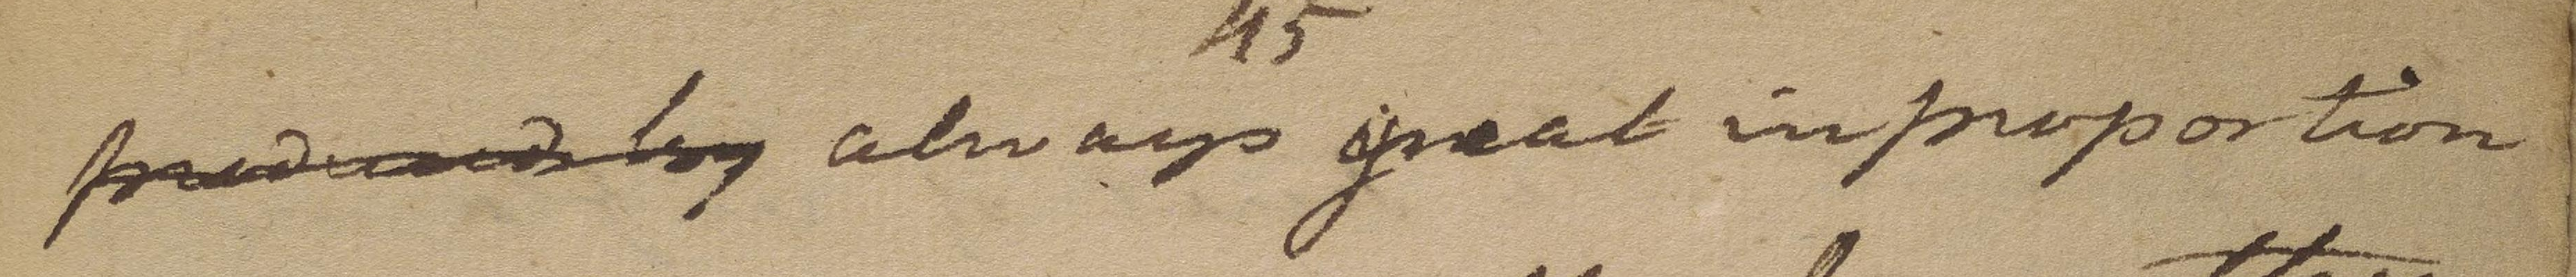[produced by] always great in proportion
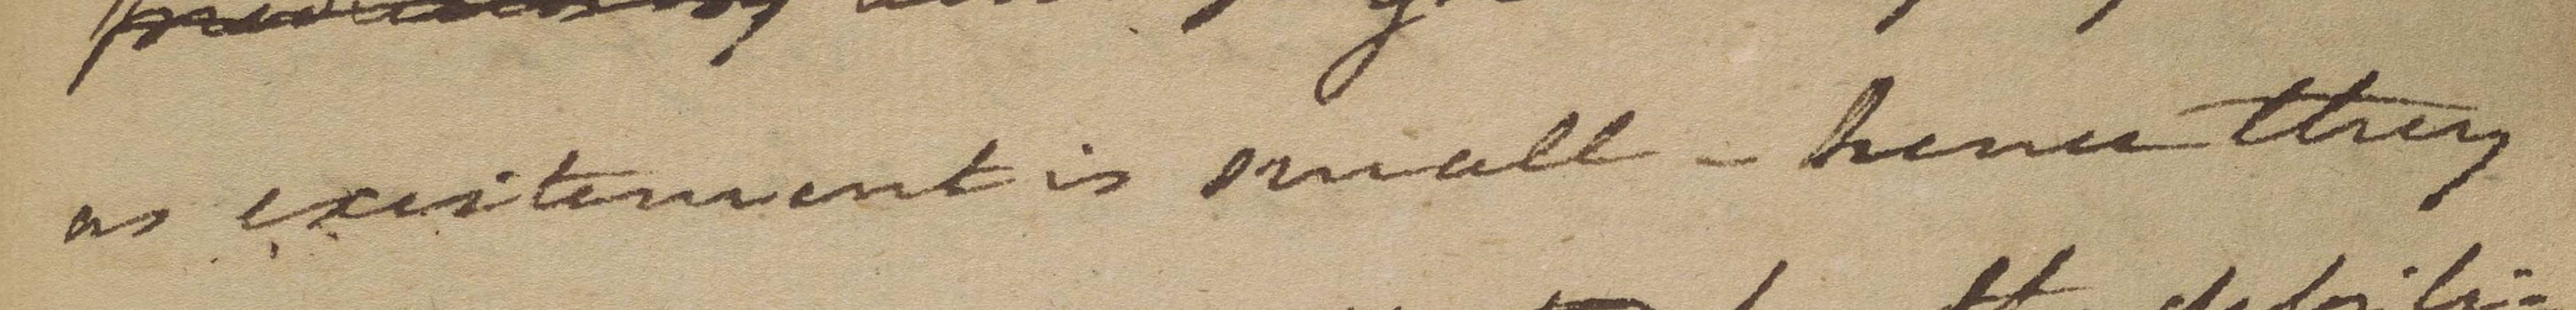as excitement is small- hence they
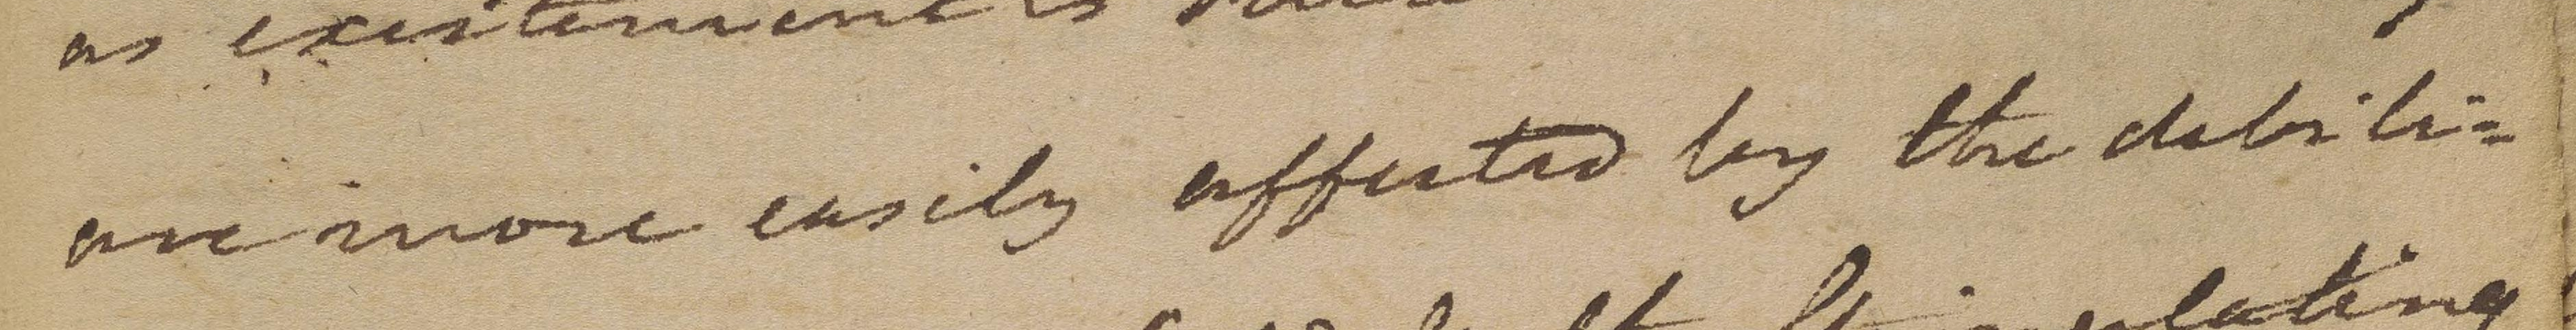are more easily affected by the debili-
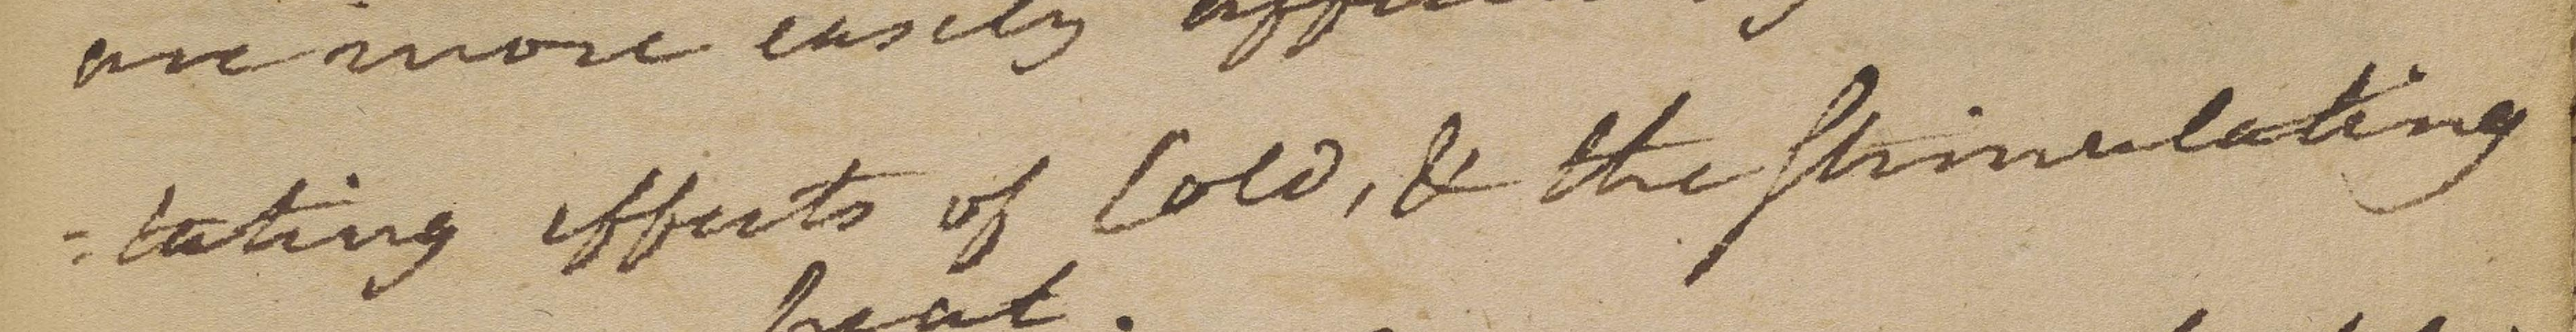-tating effects of cold, & the stimulating
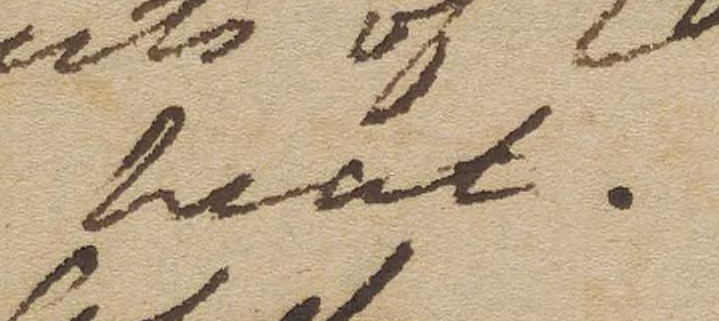heat.
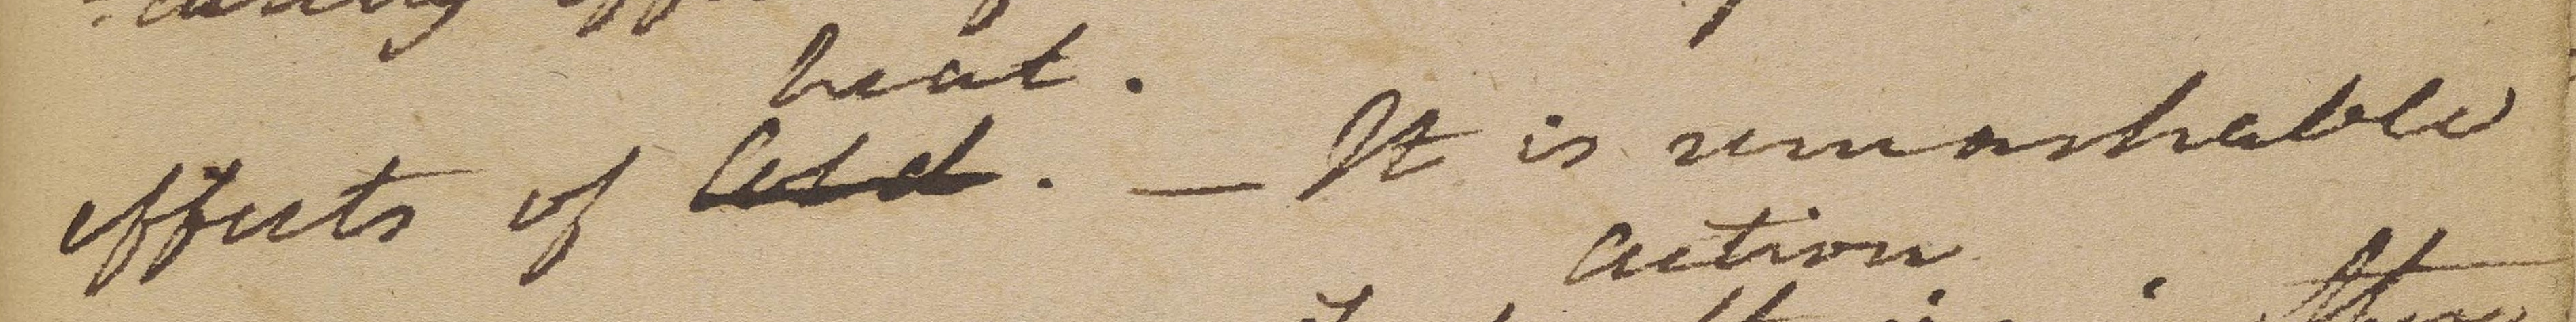effects of [Cold].- It is reasonable
